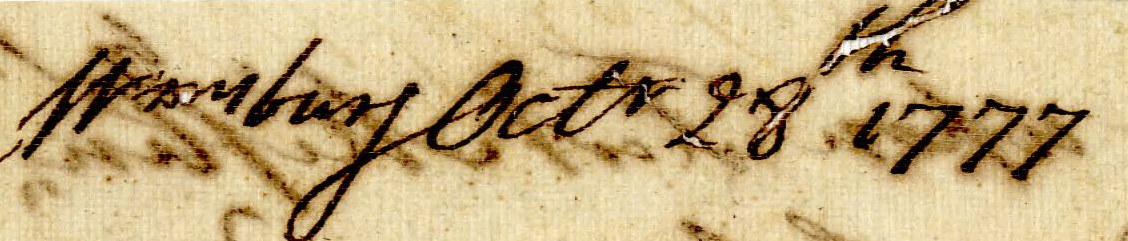Wmsburg Oct^r 28^th 1777
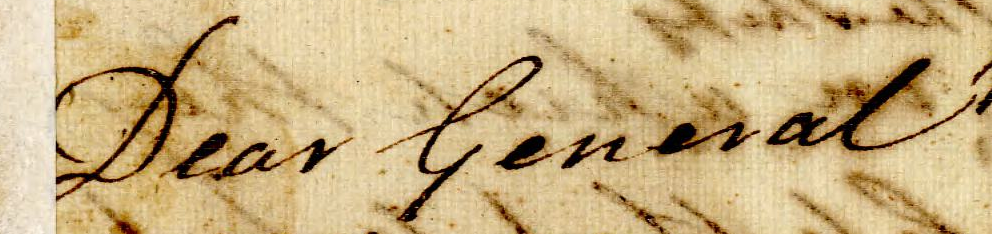Dear General
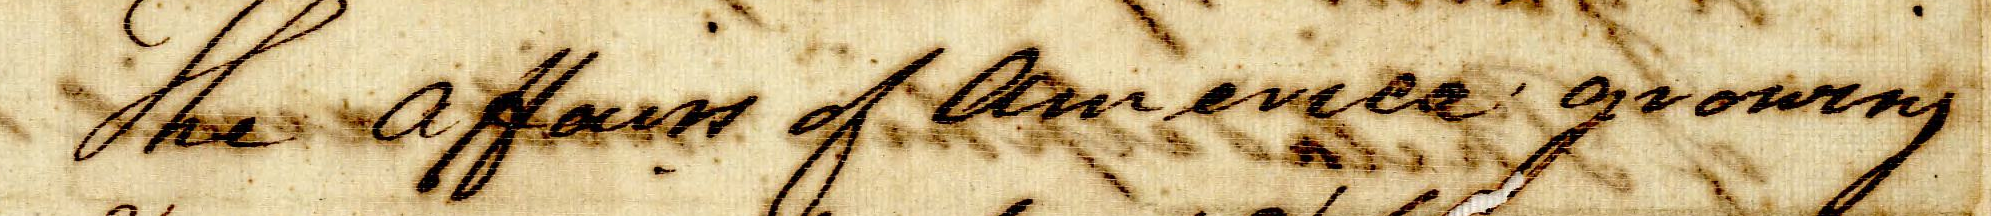The affairs of America growing
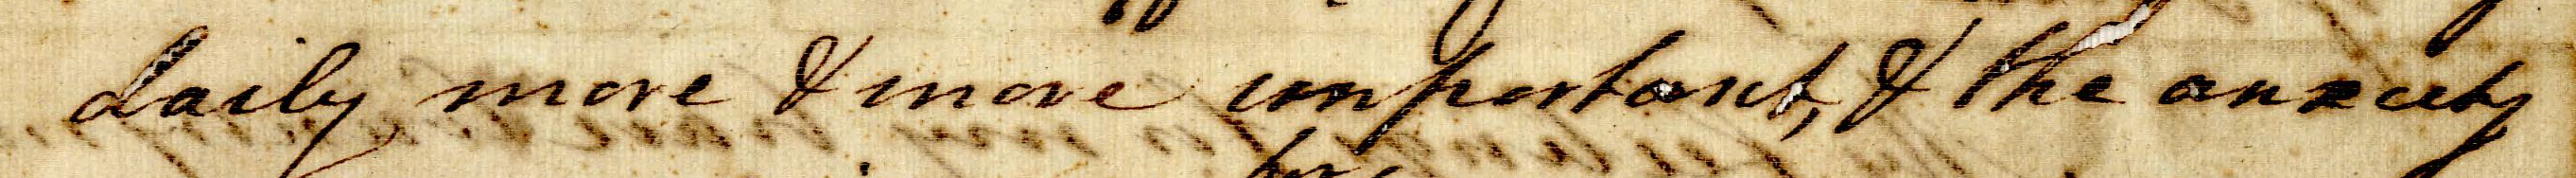daily more & more important, & the anxiety
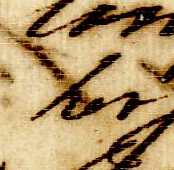her
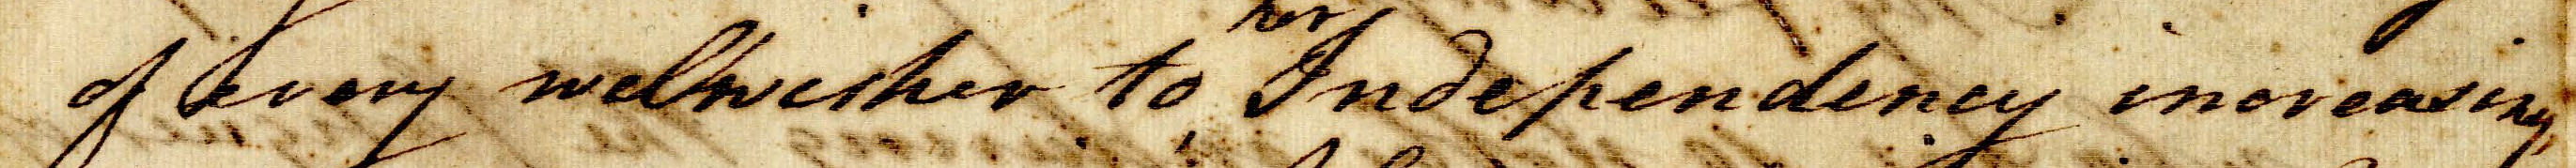of every wellwisher to Independency increasing
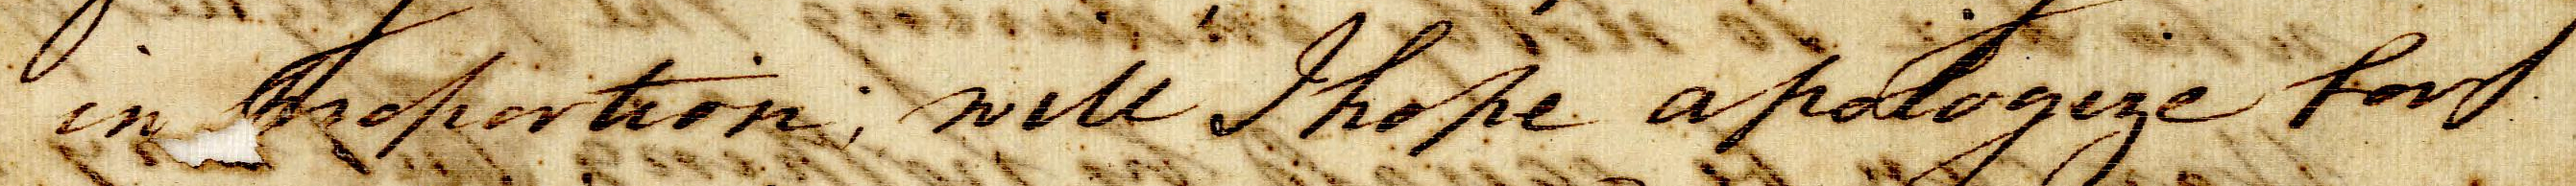in proportion; will I hope apologize for
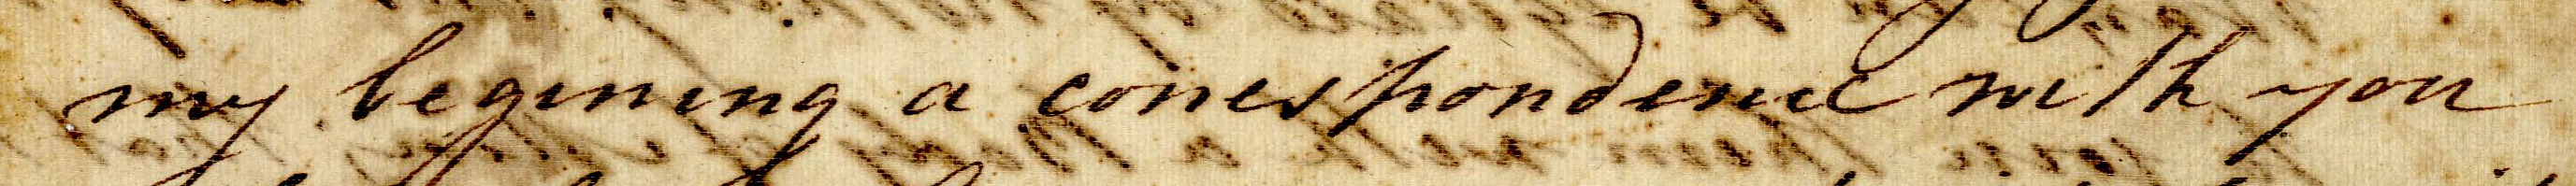my beginning a correspondence with you
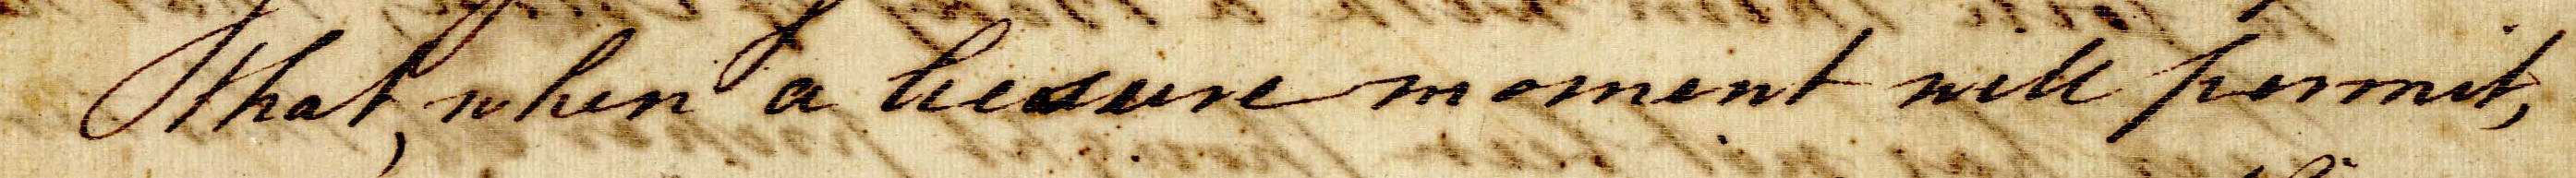that, when a leisure moment will permit,
